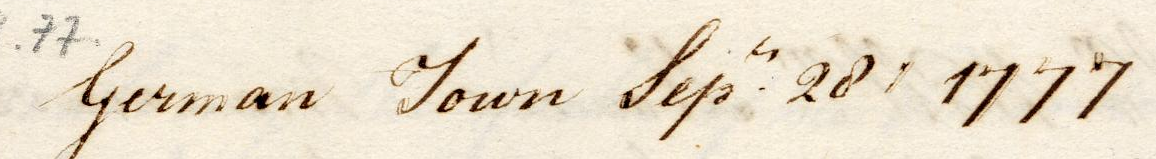German Town Sep^tr. 28: 1777
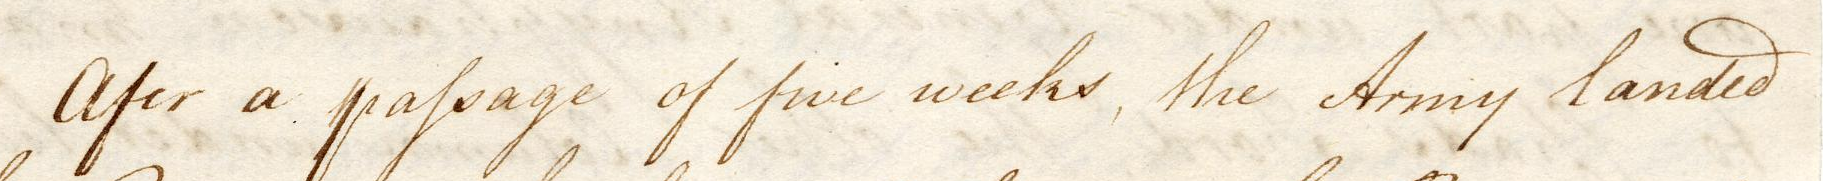Afer a passage of five weeks, the Army landed
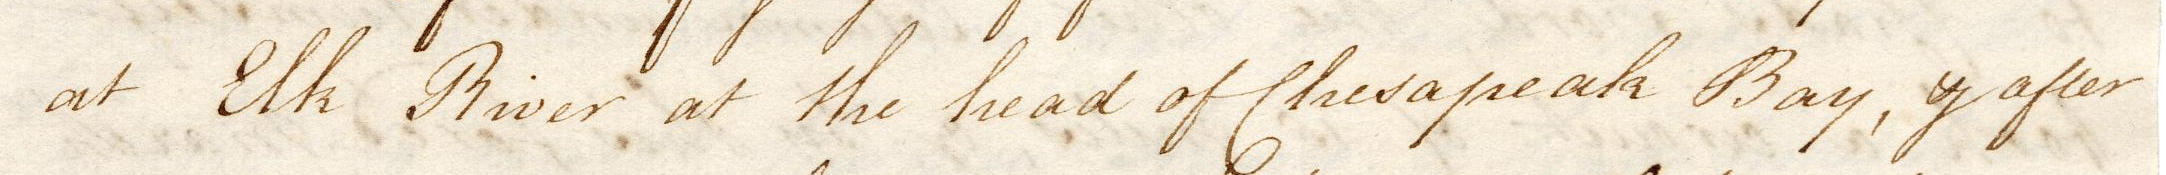at Elk River at the head of Chesapeak Bay, & after
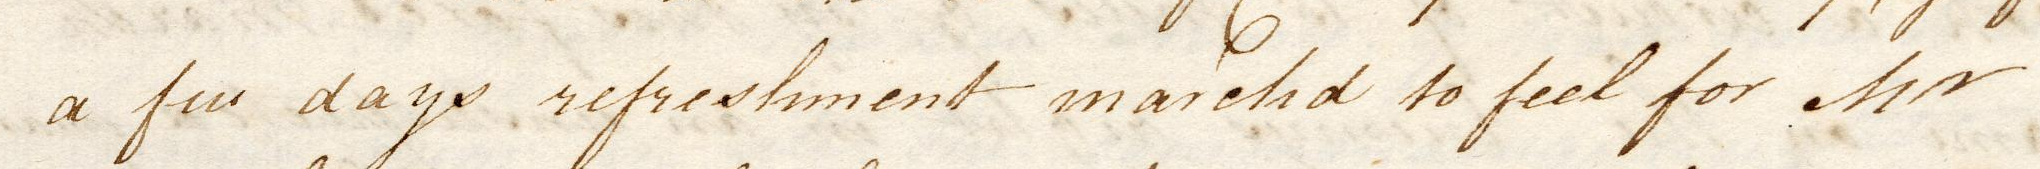a few days refreshment marchd to feel for M^r
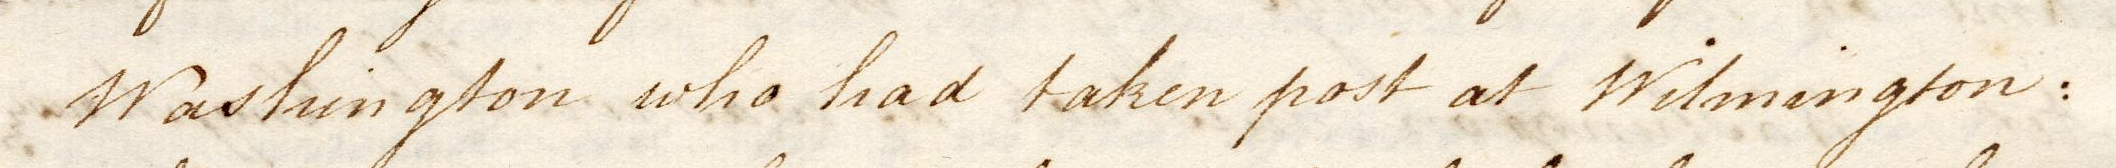Washington who head taken post at Wilmington:
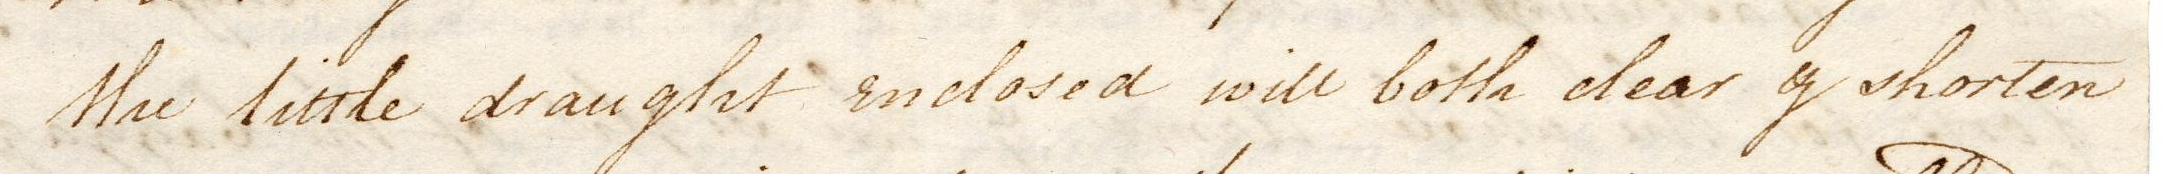the little draught enclosed will both clear & shorten
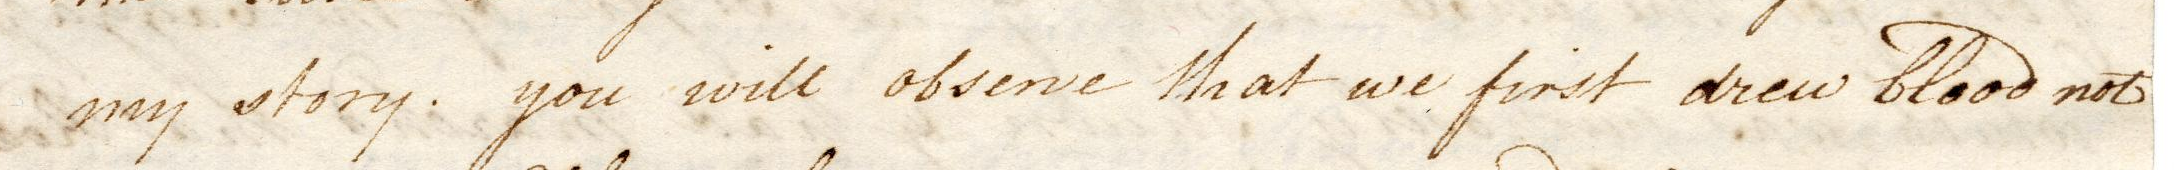my story. you will observe that we first drew blood not
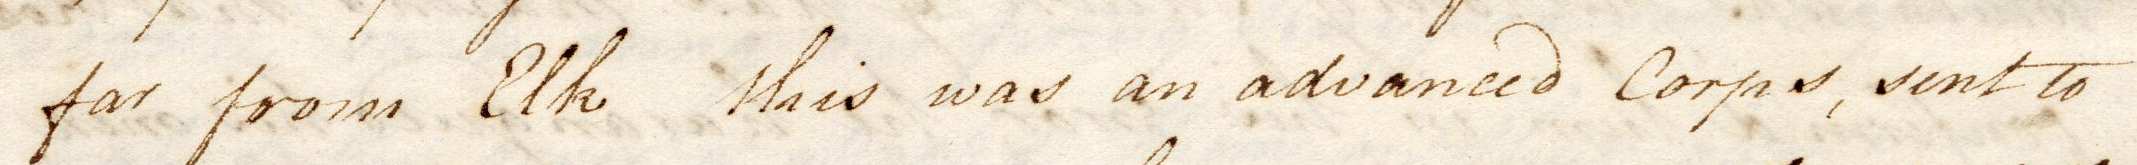far from Elk this was an advanced Corps, sent to
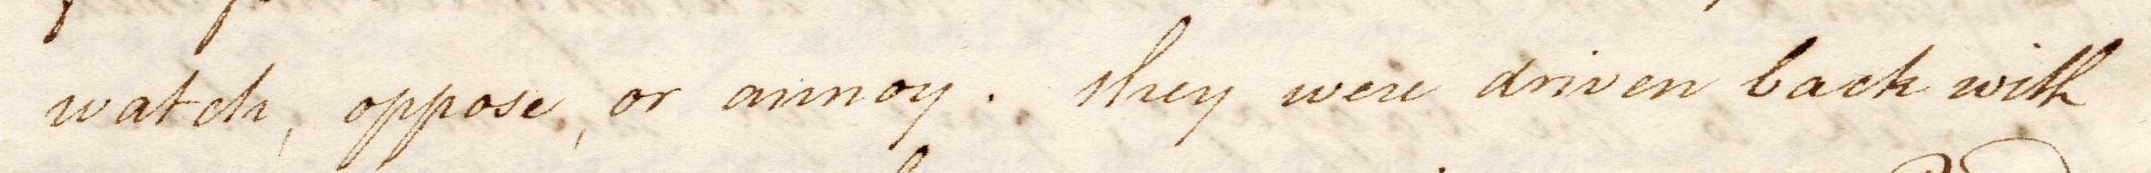watch, oppose or annoy. they were driven back with
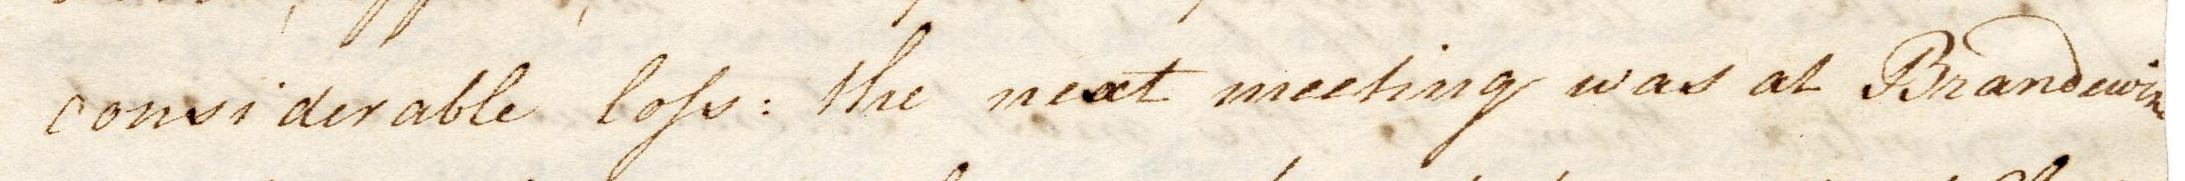considerable loss: the next meeting was at Brandewine
